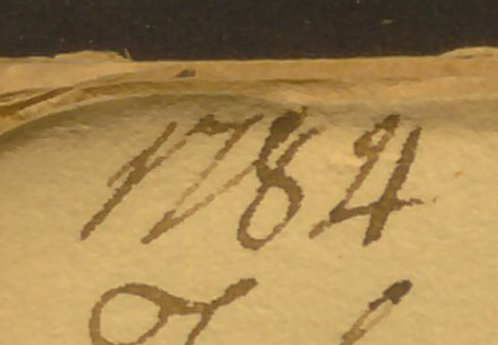1784
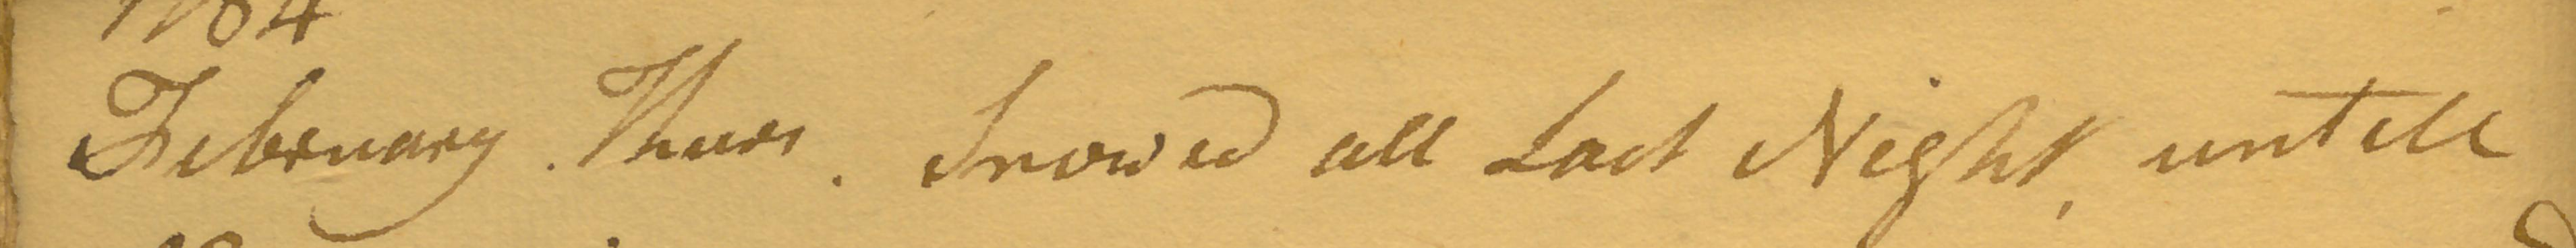February Thurs. snowed all Last Night untill
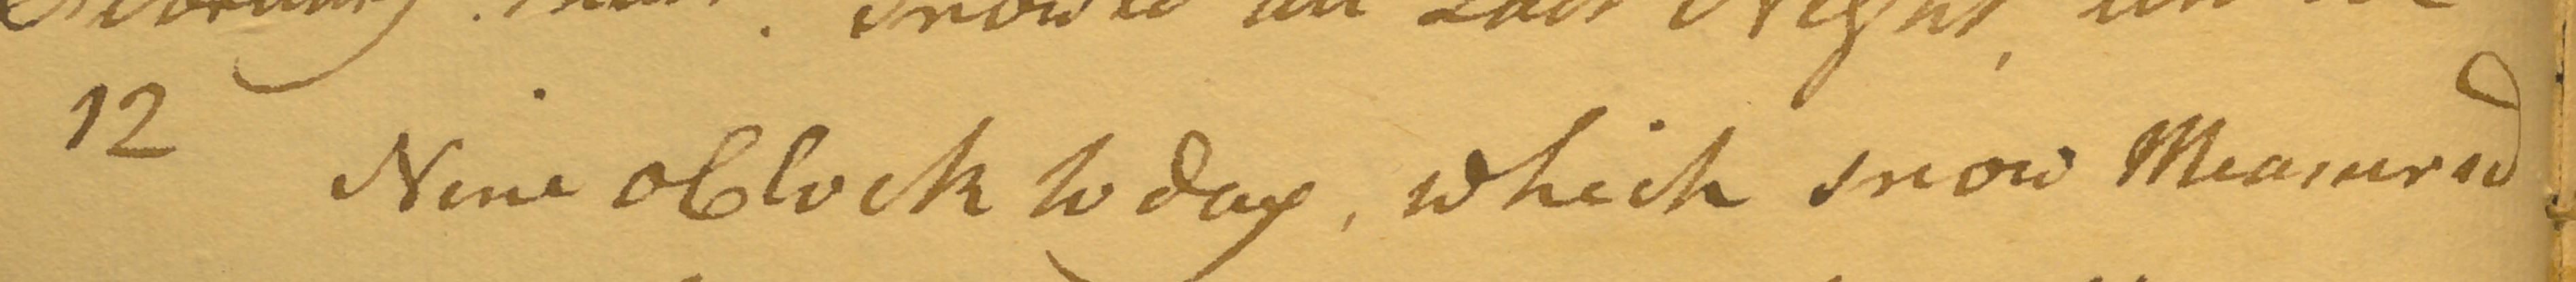12 Nine oClock today which snow Measured
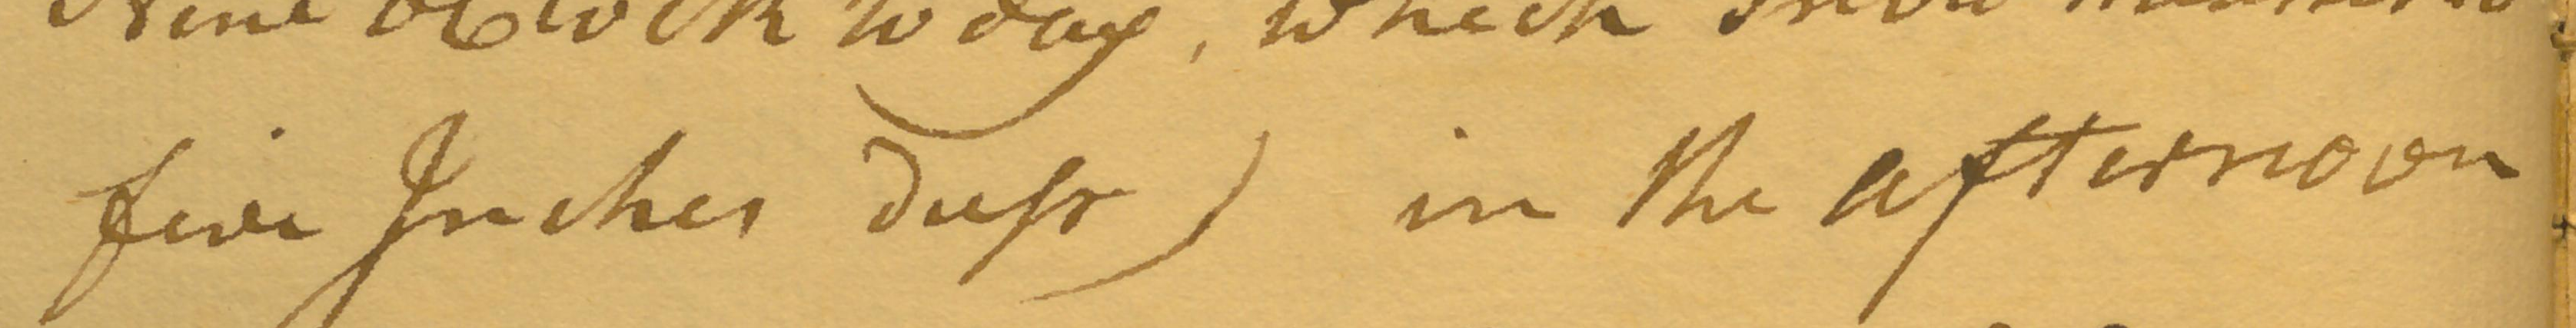five Inches deep) in the afternoon
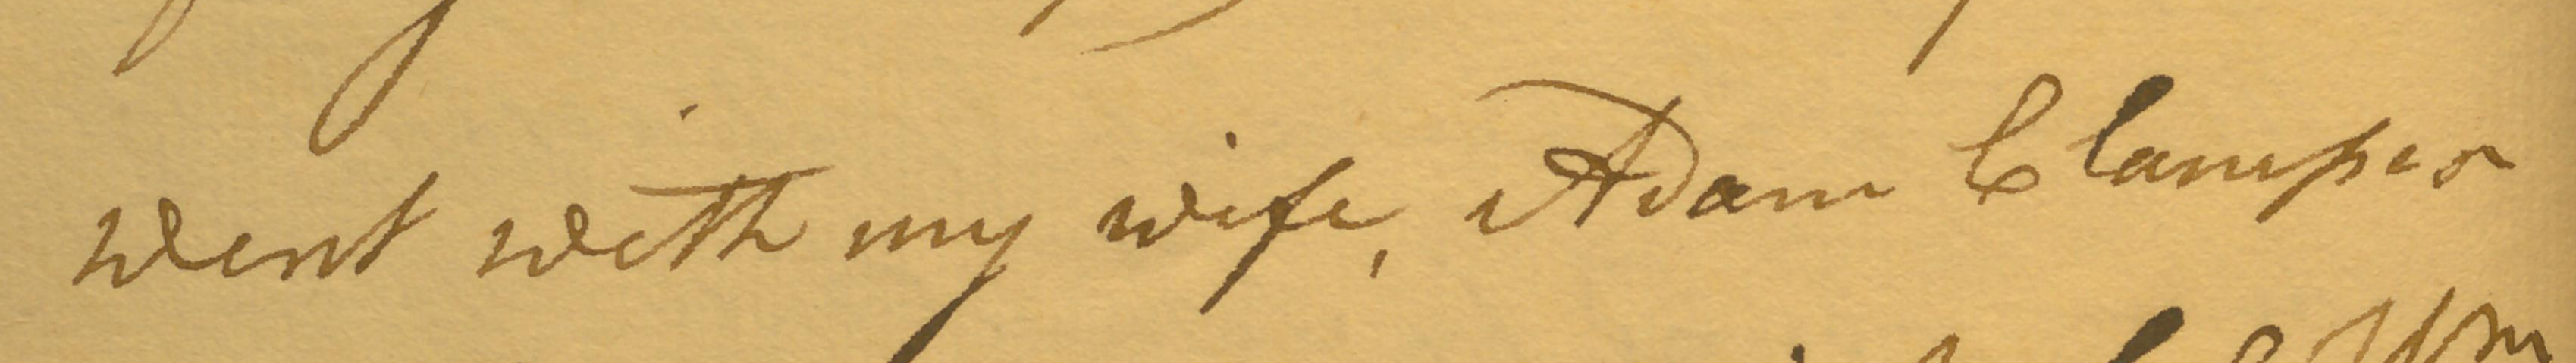went with my wife Adam Clamper
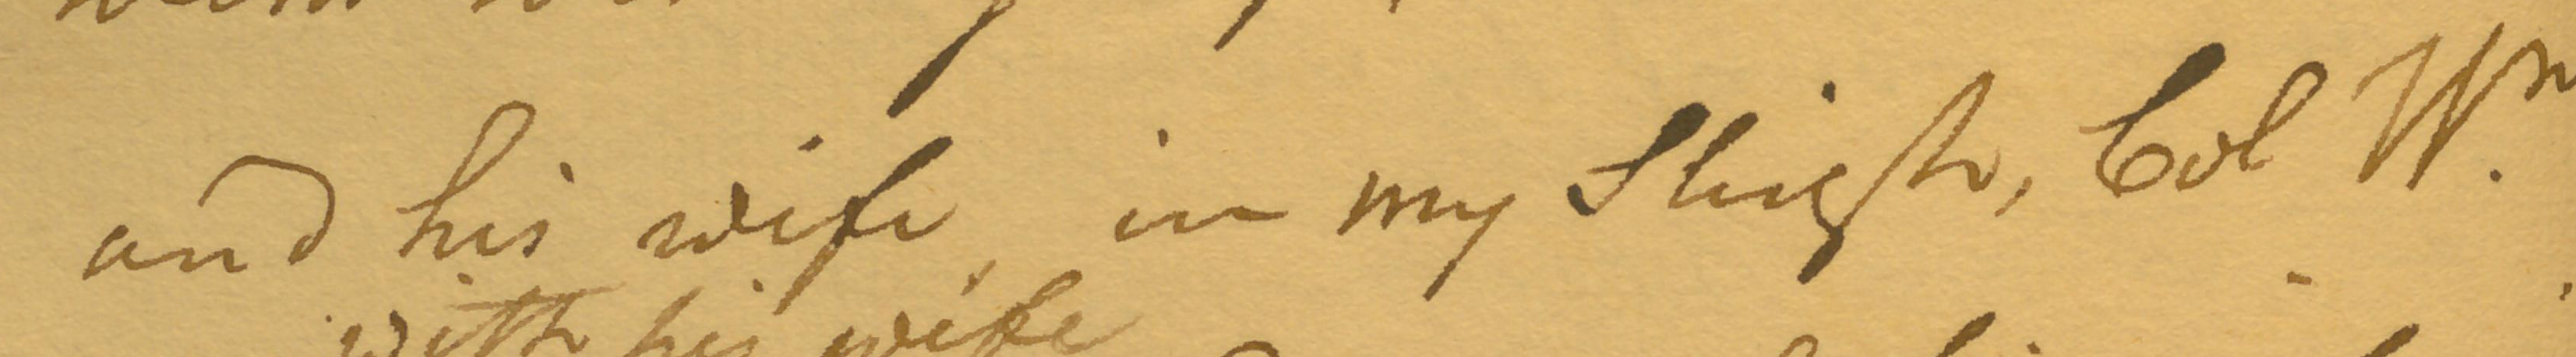and his wife in my Sleigh, Col W^.m
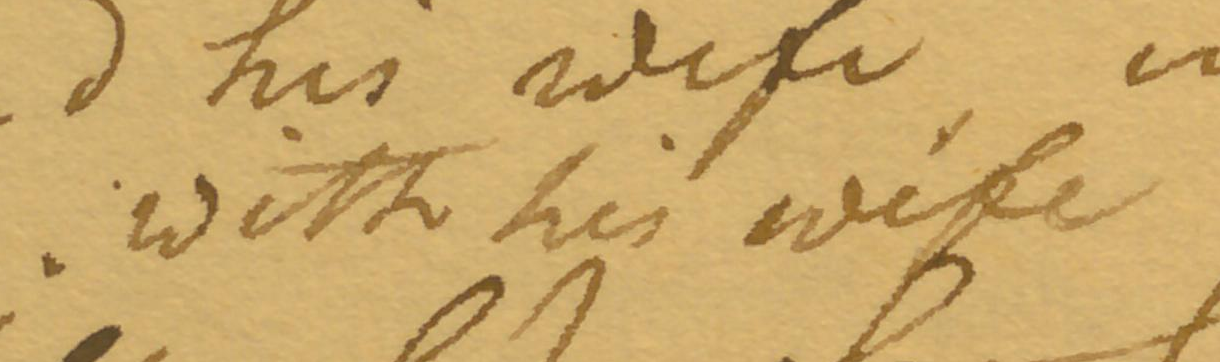with his wife
